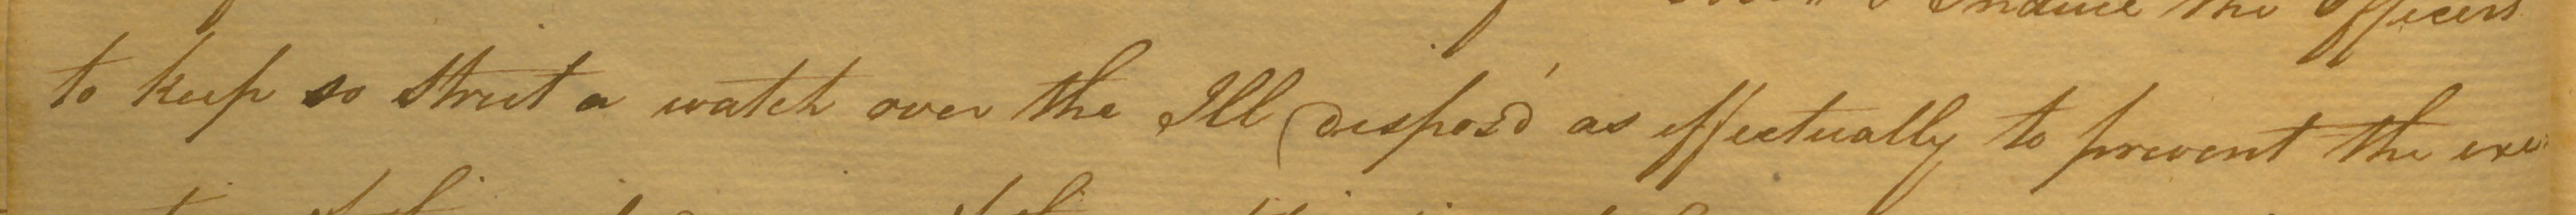to keep a strict watch over the Ill dispos'd as effectually to prevent the exe
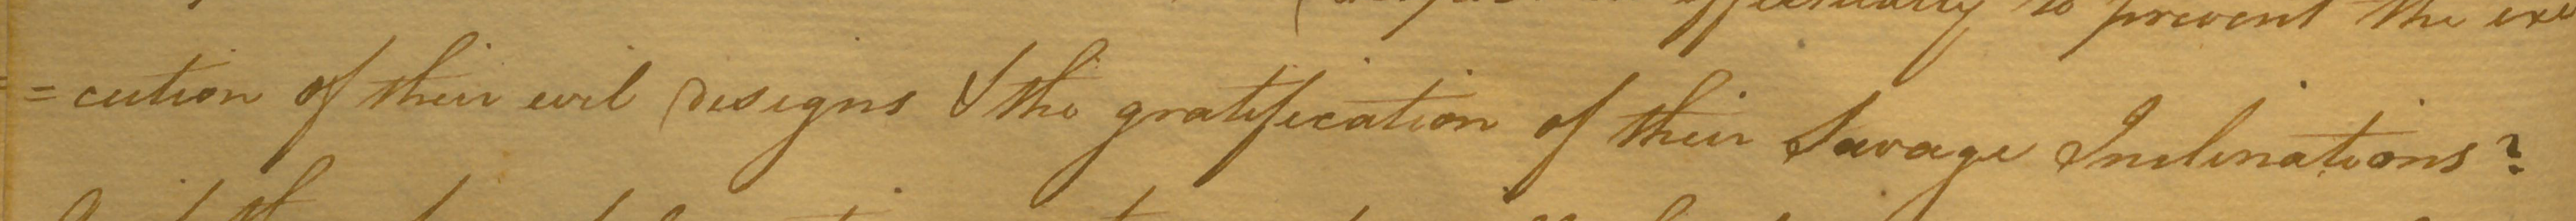-cution of their evil designs & the gratification of their Savage Inclinations?
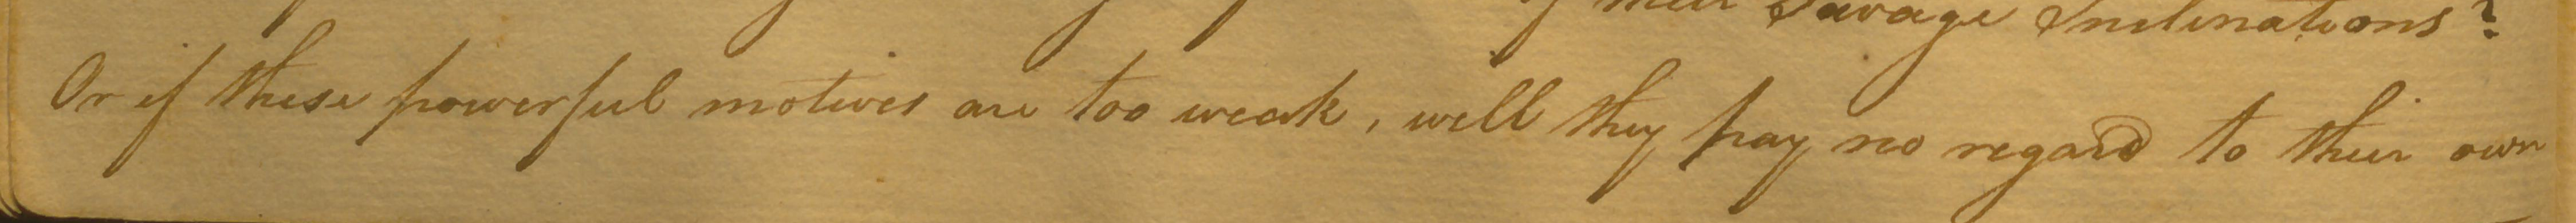Or if these powerful motives are too weak, will they pay no regard to their own
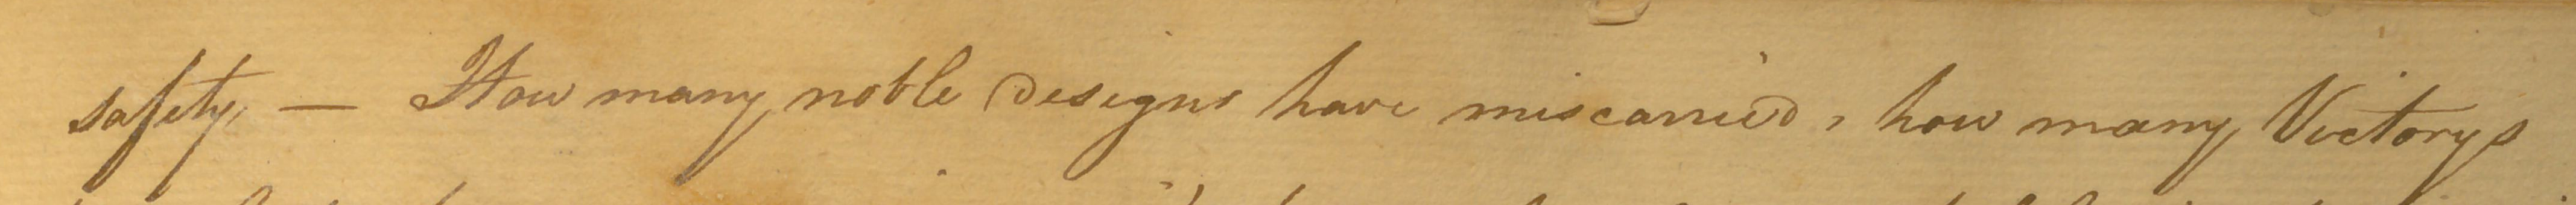safety- How many noble designs have miscarried, how many Victorys
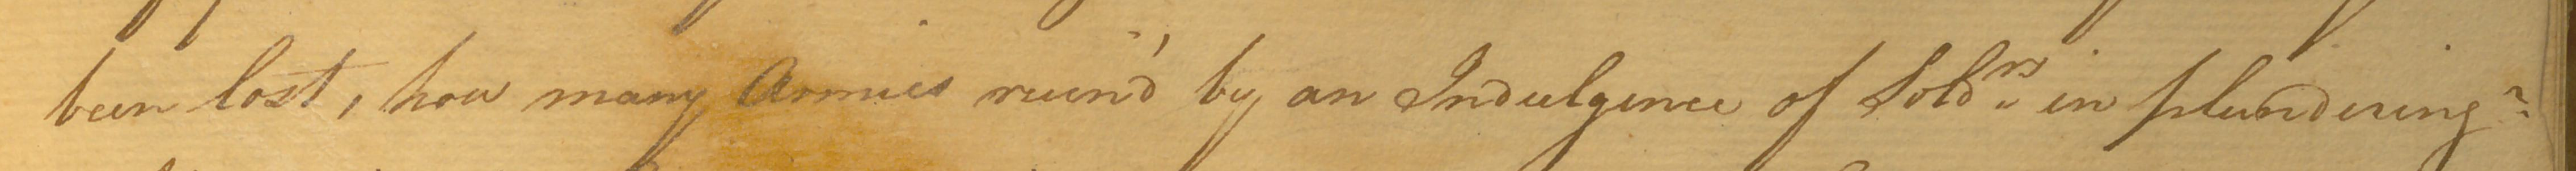been lost, how many Armies ruin'd by an Indulgence of Sold^rs. in plundering?
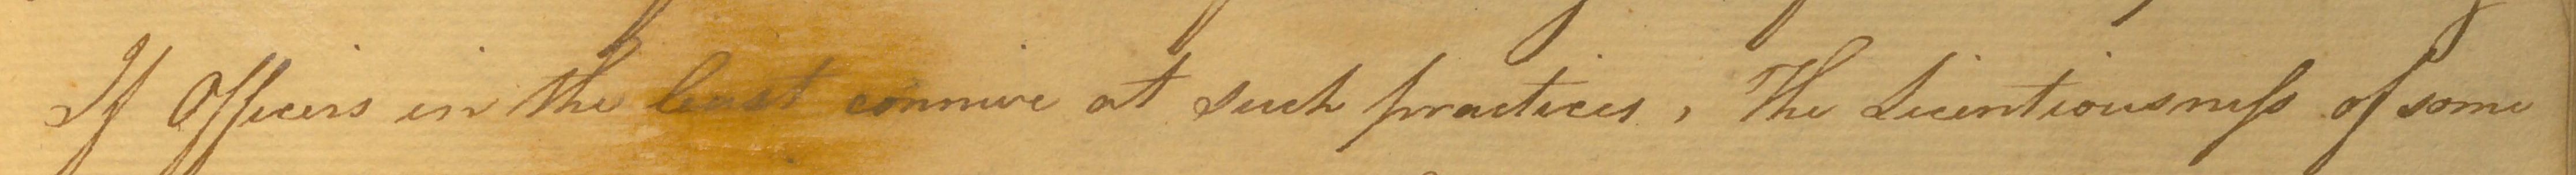If Officers in the least connive at such practices, The Licentiousness of some
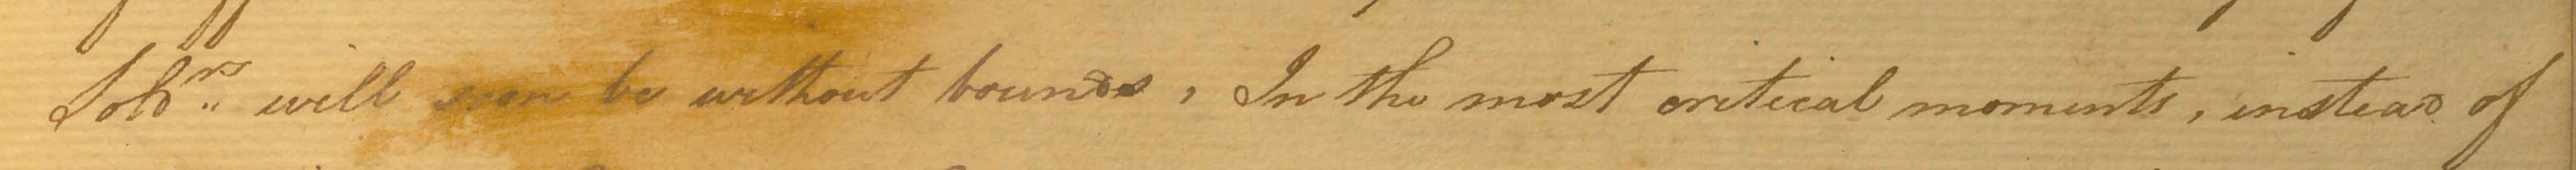Sold^rs. will soon be without bounds. In the most critical moments, instead of
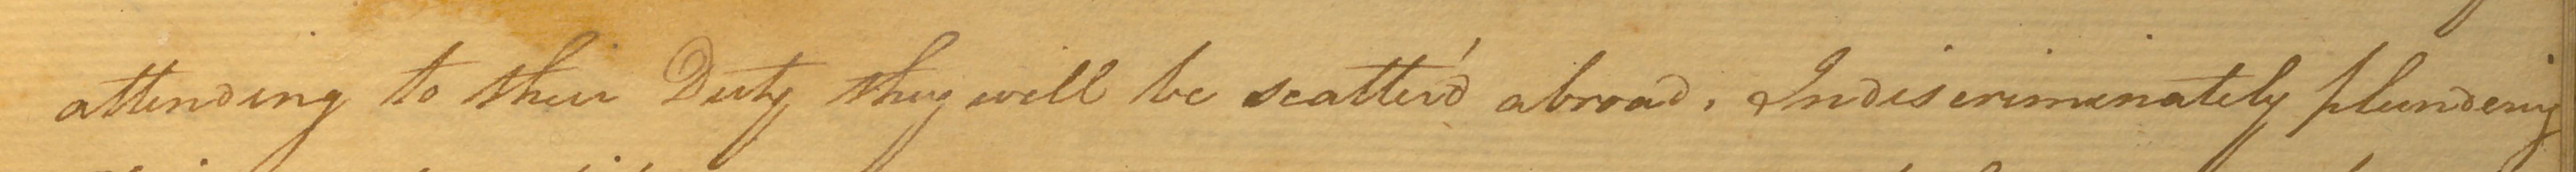attending to their Duty they will be scatter'd abroad, Indiscriminately plundering
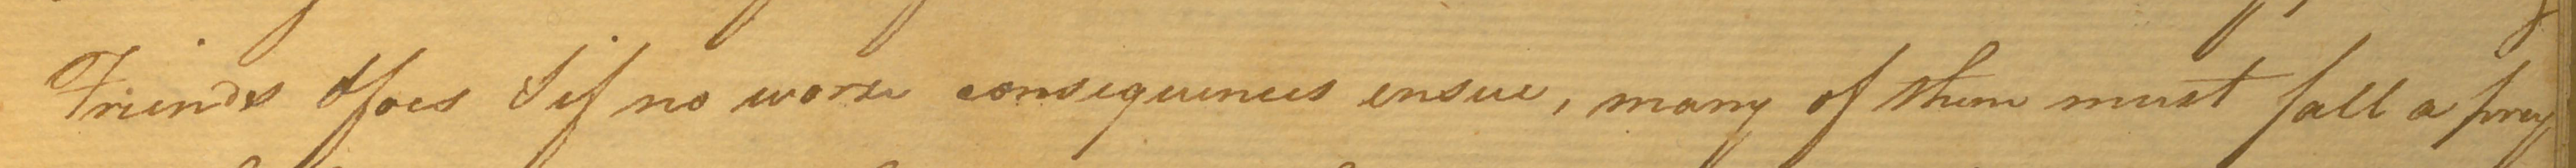Friends & foes & if no worse consequences ensue, many of them must fall a prey
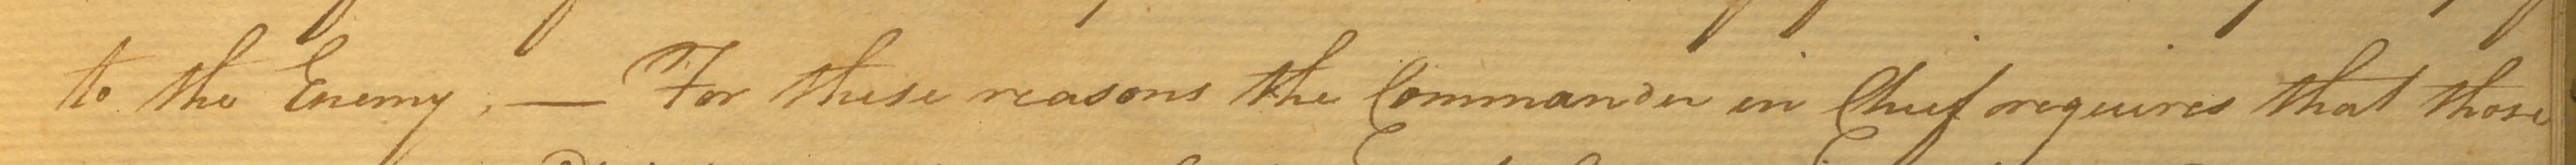to the Enemy.- For these reasons the Commander in Chief requires that those
